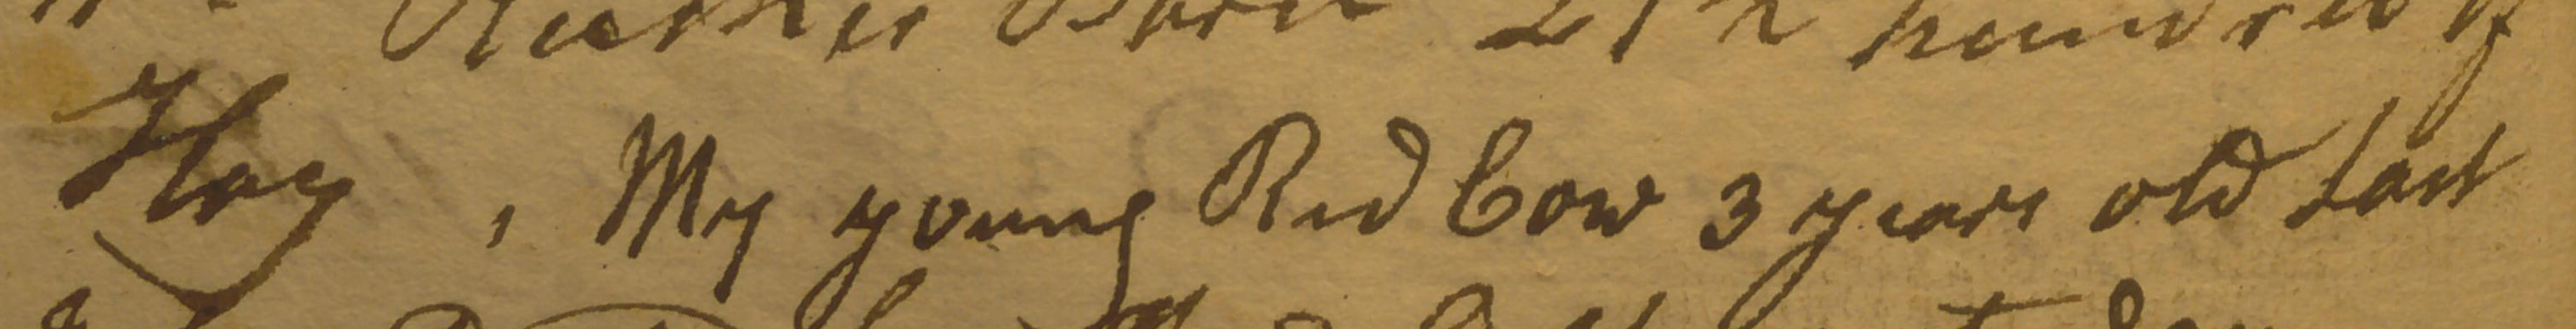Hay, My young Red Cow 3 years old Last
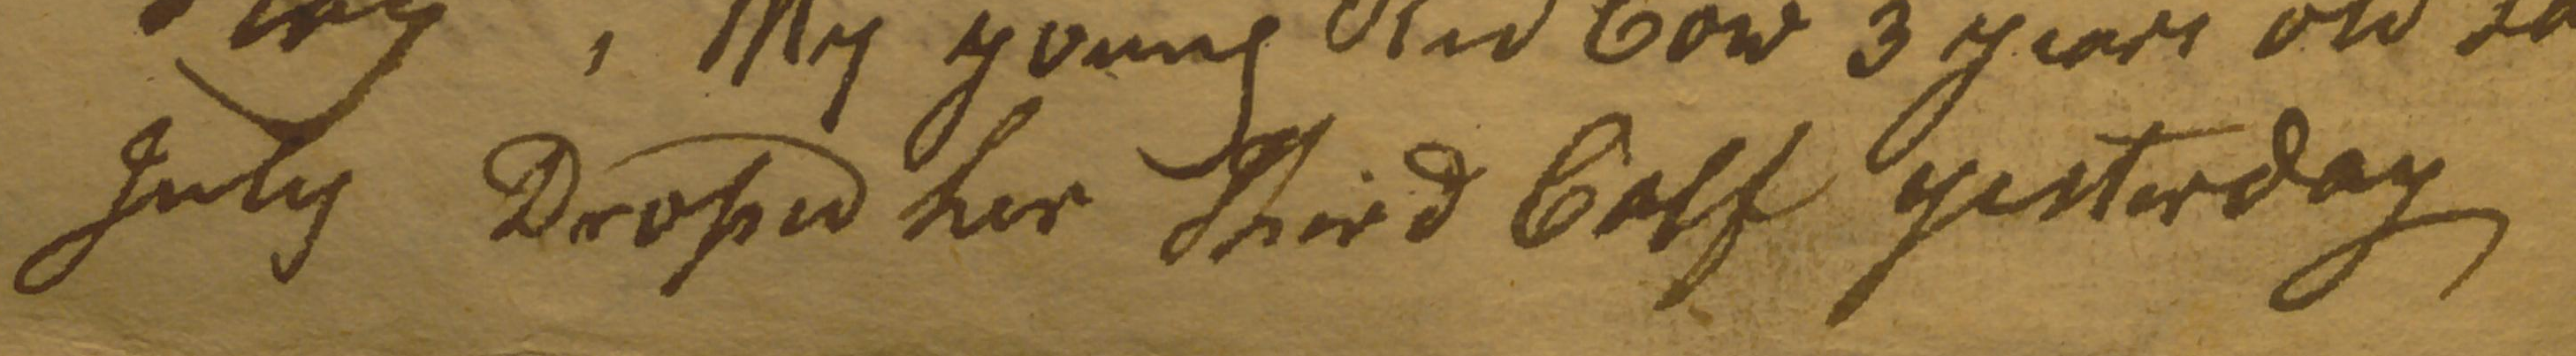Joley Droped her Third Calf yesterday
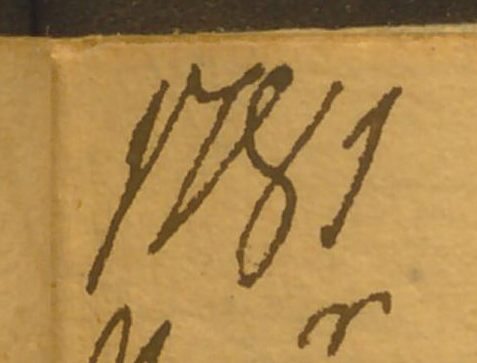1781
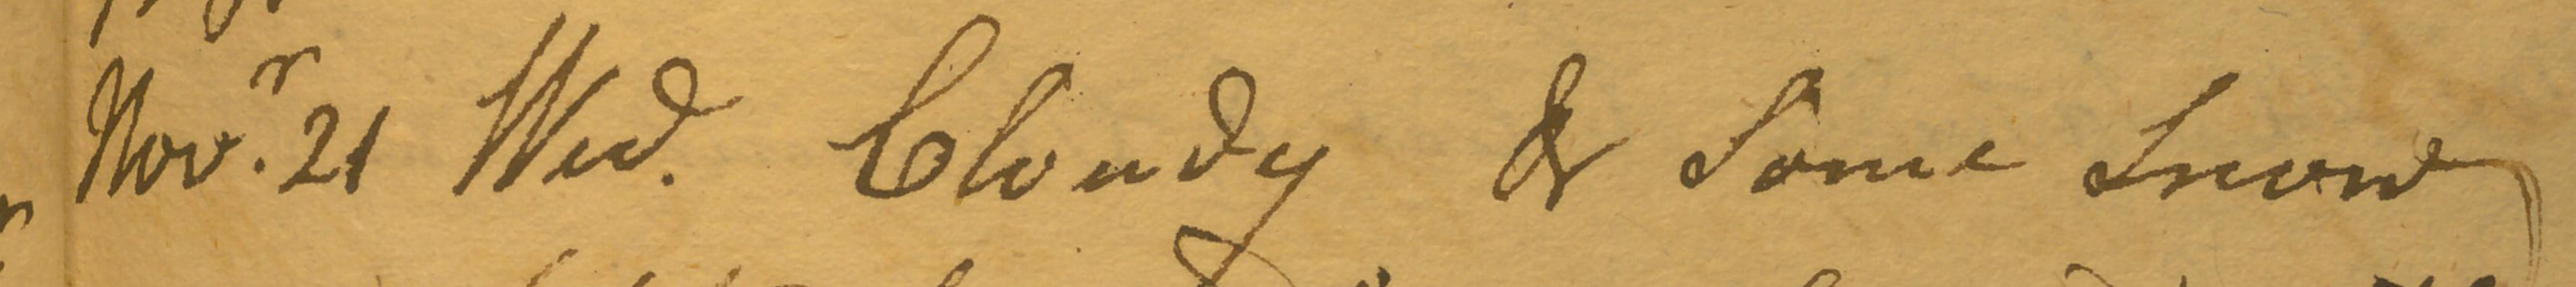Nov^r. 21 Wed. Cloudy & some snow
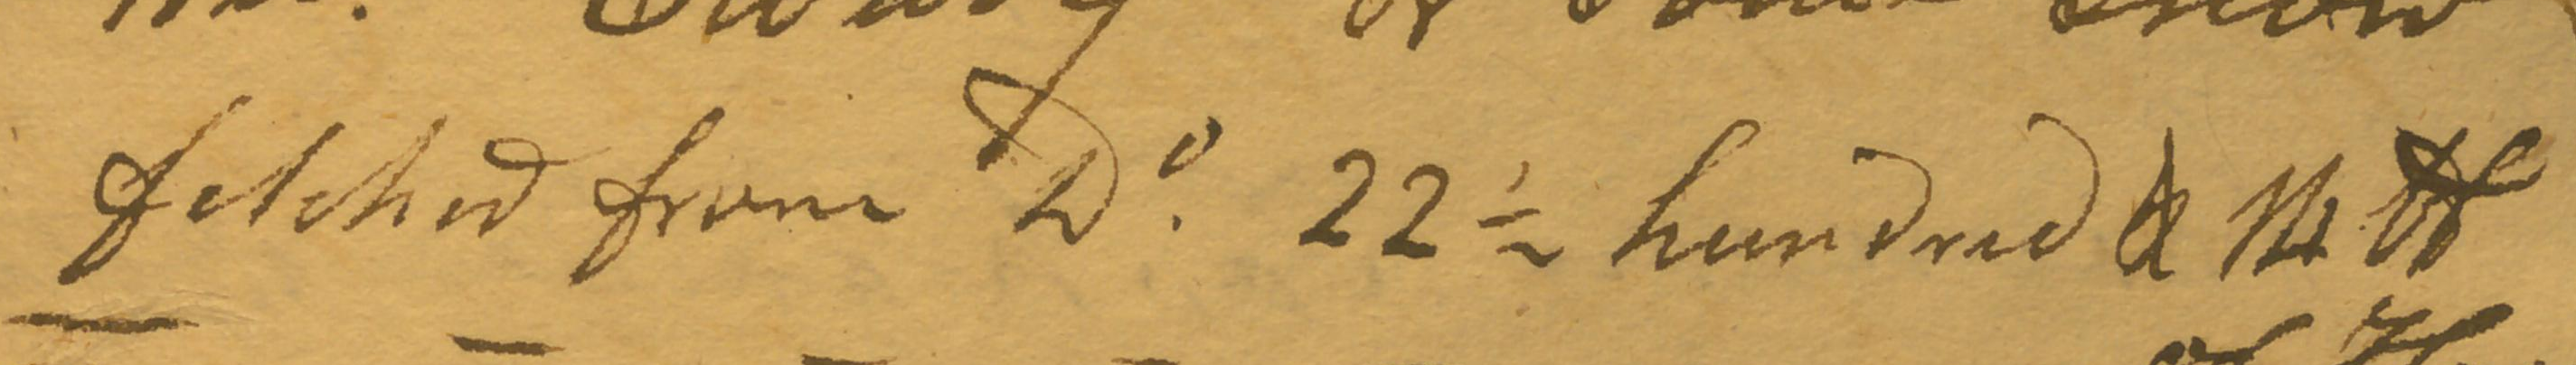fetched from D^o. 22 1/2 hundred & 14 lb
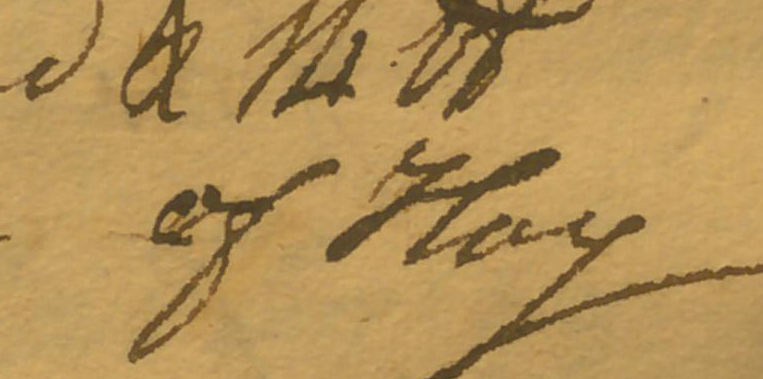of Hay
